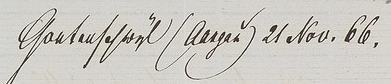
Gontenschwyl (Aargau) 21 Nov. 66.
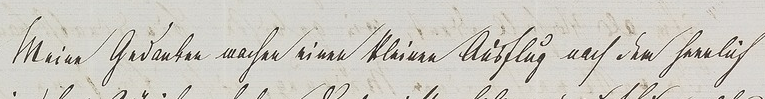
Meine Gedanken machen einen kleinen Ausflug nach dem herrlich
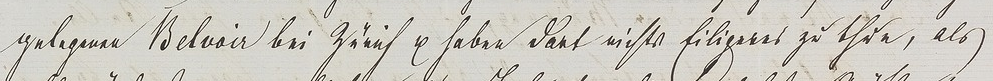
gelegenen Belvoir bei Zürich & haben dort nichts Eiligeres zu thun, als
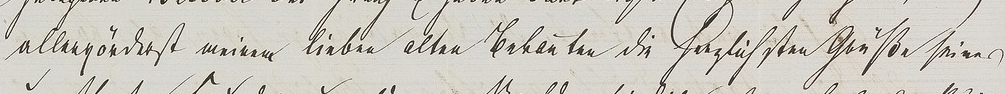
allervörderst meinem lieben alten Bekannten die herzlichsten Grüße seines
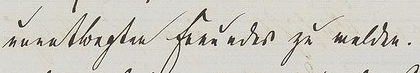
unentwegten Freundes zu melden.
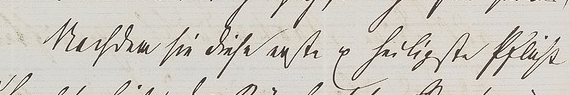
Nachdem sie diese erste & heiligste Pflicht
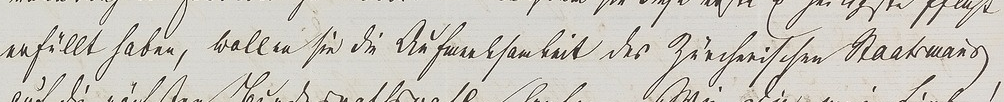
erfüllt haben, wollen sie die Aufmerksamkeit des Zürcherischen Staatsmanns
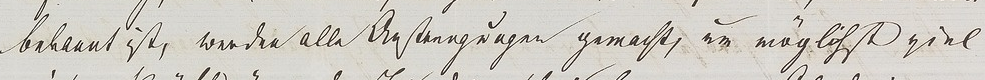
bekannt ist, werden alle Anstrengungen gemacht, um möglichst viel
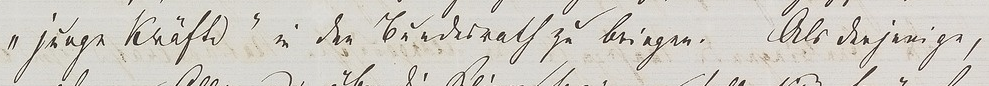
«junge Kräfte» in den Bundesrath zu bringen. Als derjenige,
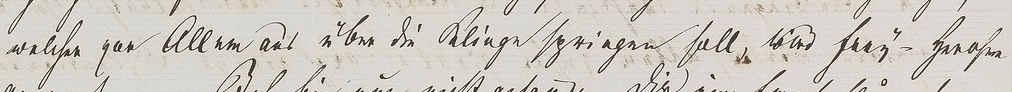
welcher vor Allem aus über die Klinge springen soll, wird Frey-Herosee
